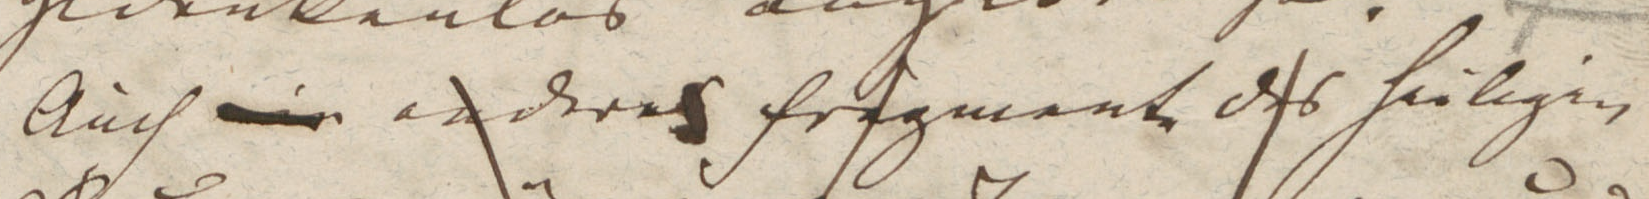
Auch wir anderes Fragment des heiligen
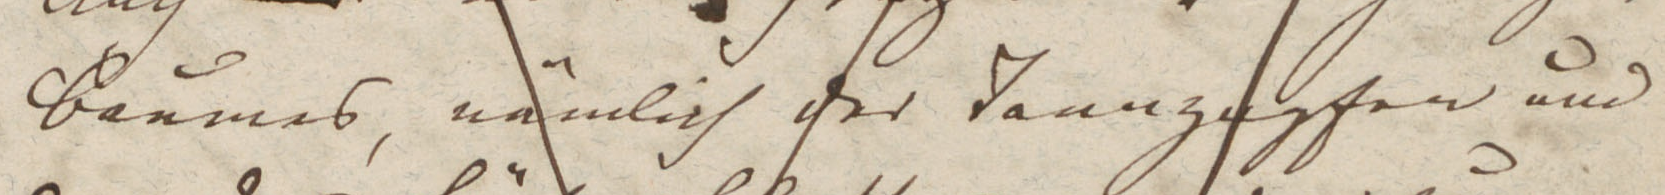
Baumes, nämlich der Tannzapfen und
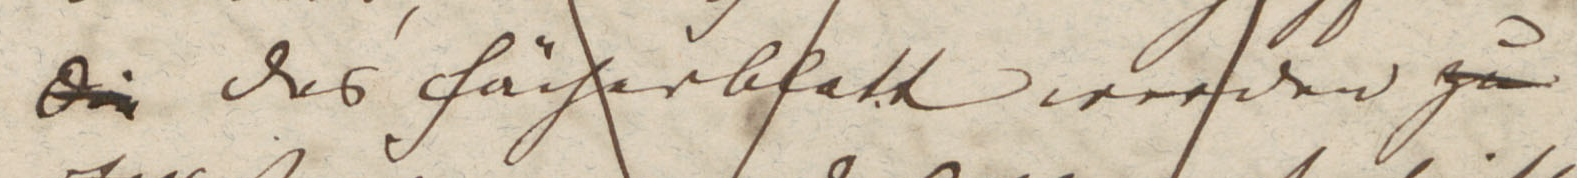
die das Fächerblatt werden zu
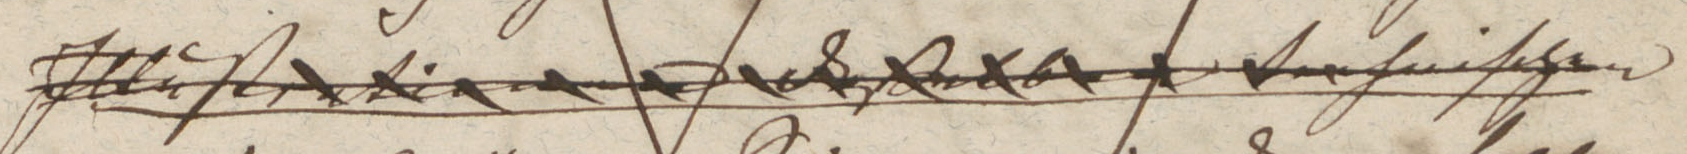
Illustrationen desselben technischen
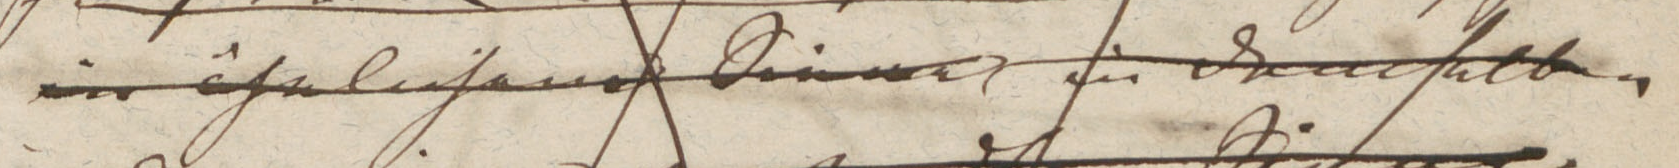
in ähnlichem Sinne, in demselben
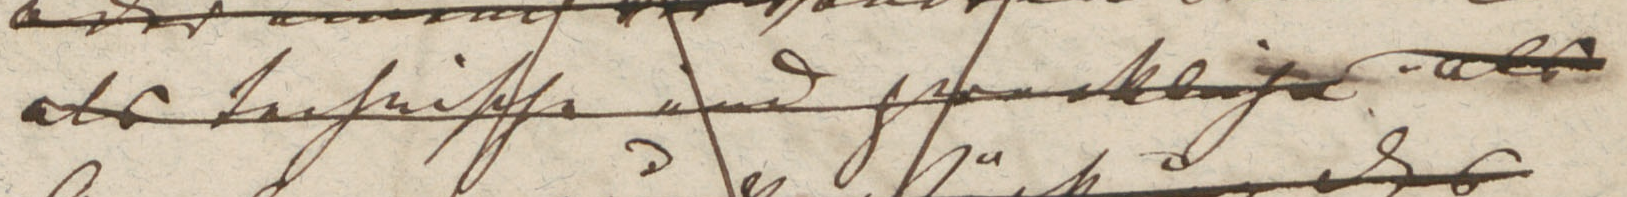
als technische und zweckliche als
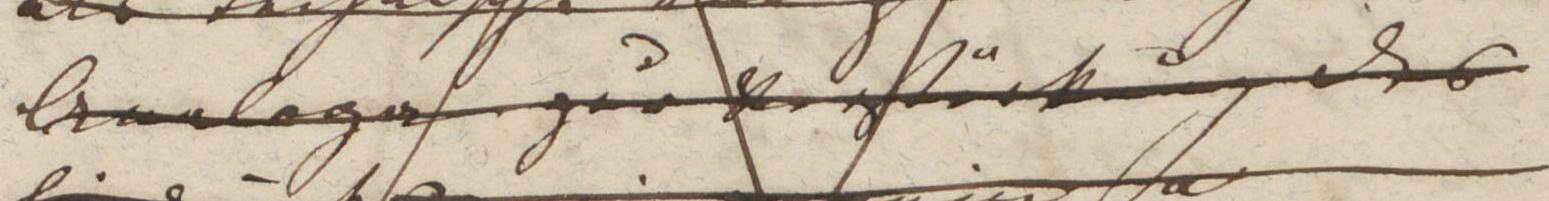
Analoga zur Verstärkung des
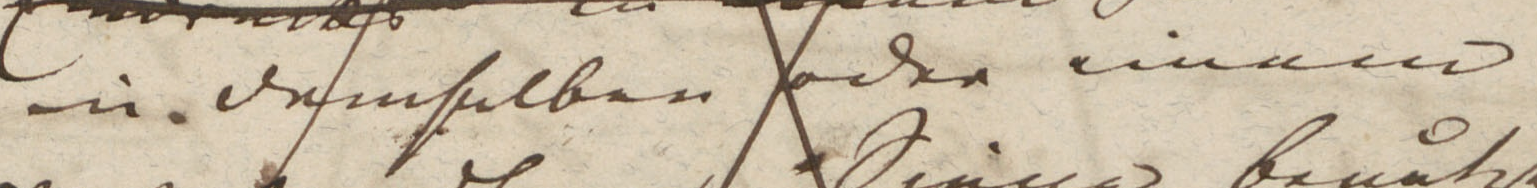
in demselben oder einem
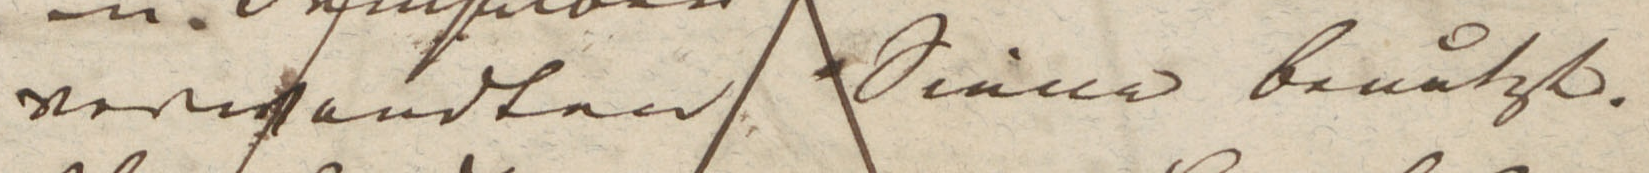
verwandten Sinne benutzt.
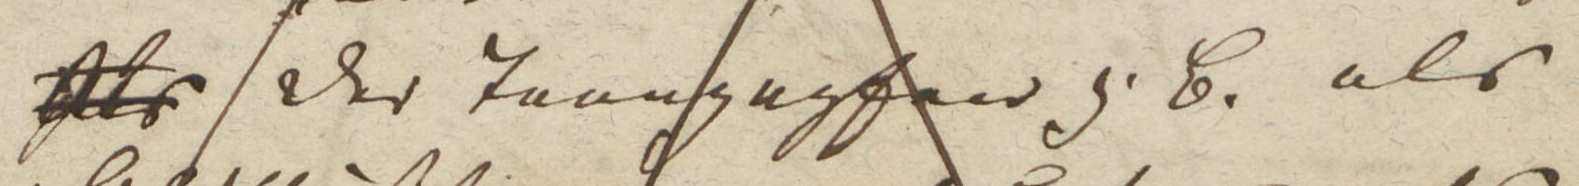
Als Der Tannzapfen z. B. als
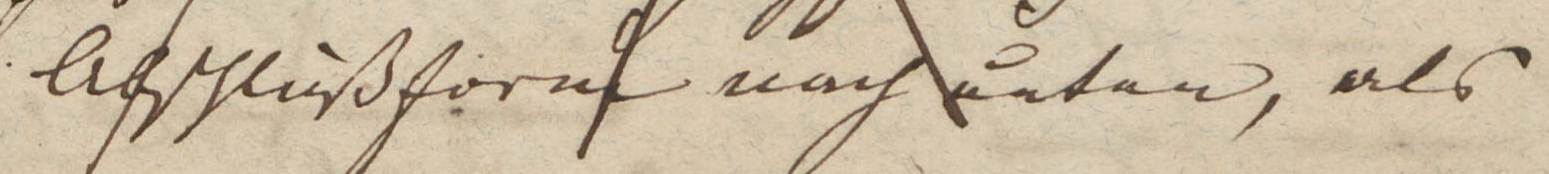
Abschlussform nach unten, als
